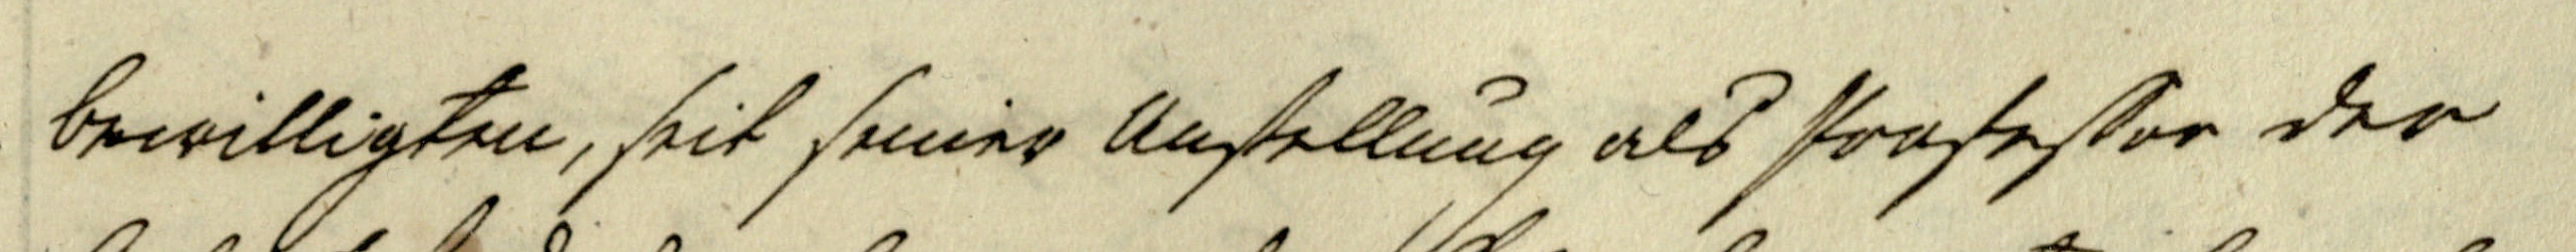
bewilligten, seit seiner Anstellung als Professor der
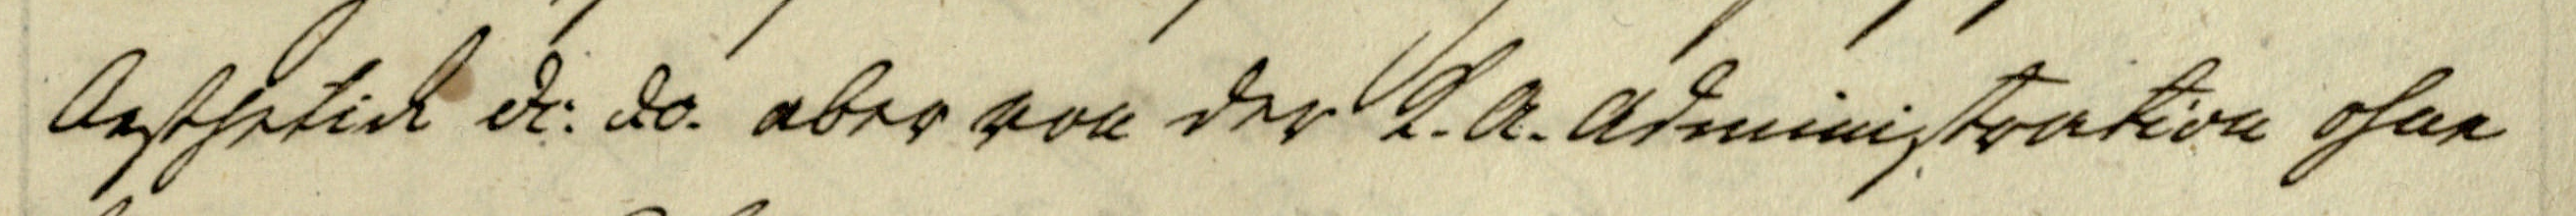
Aesthetick dc. d.o. aber von der K. A. Administration ohne
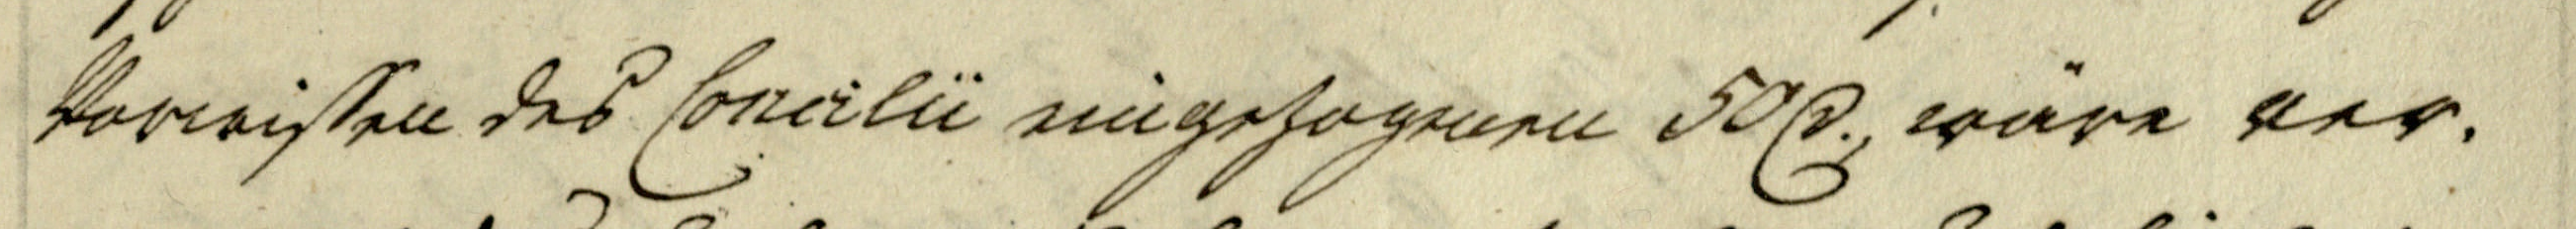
Vorwissen des Concilii eingezogenen 50 l., wäre ver¬
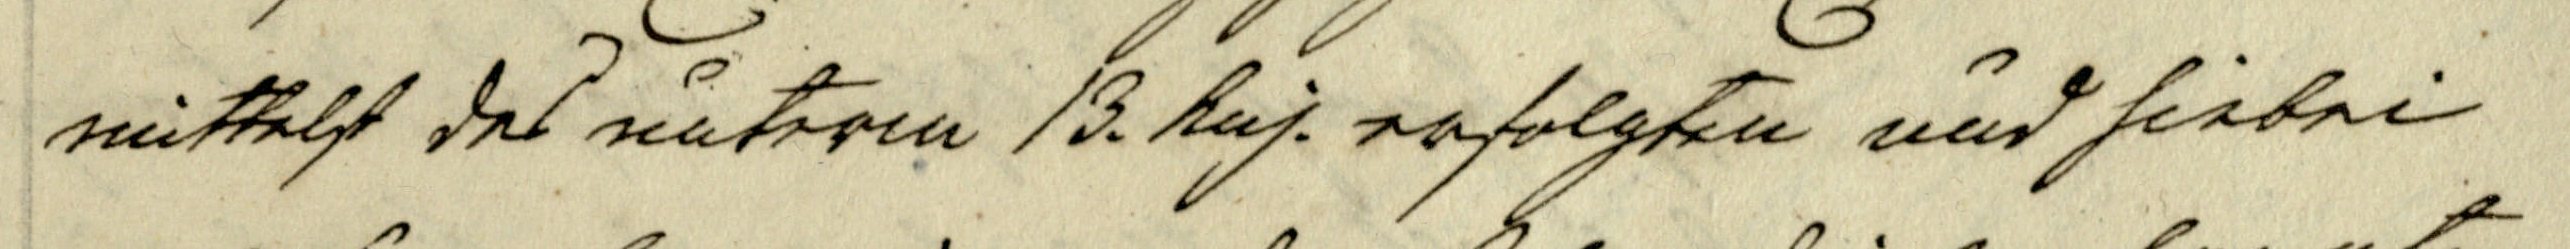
mittelst des unterm 13. huj. erfolgten und hiebei
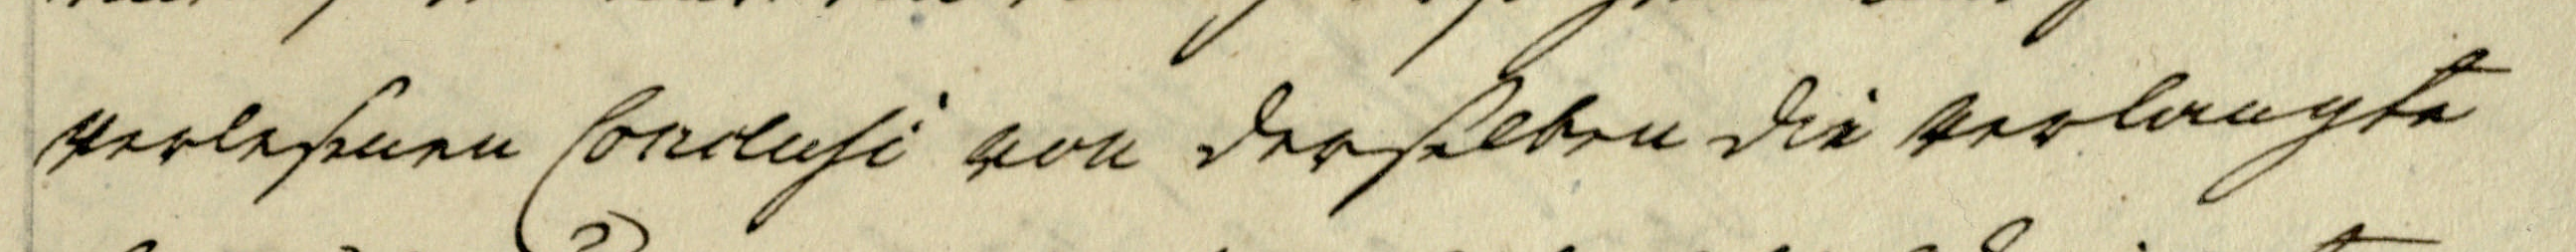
verlesenen Conclusi von derselben die verlangte
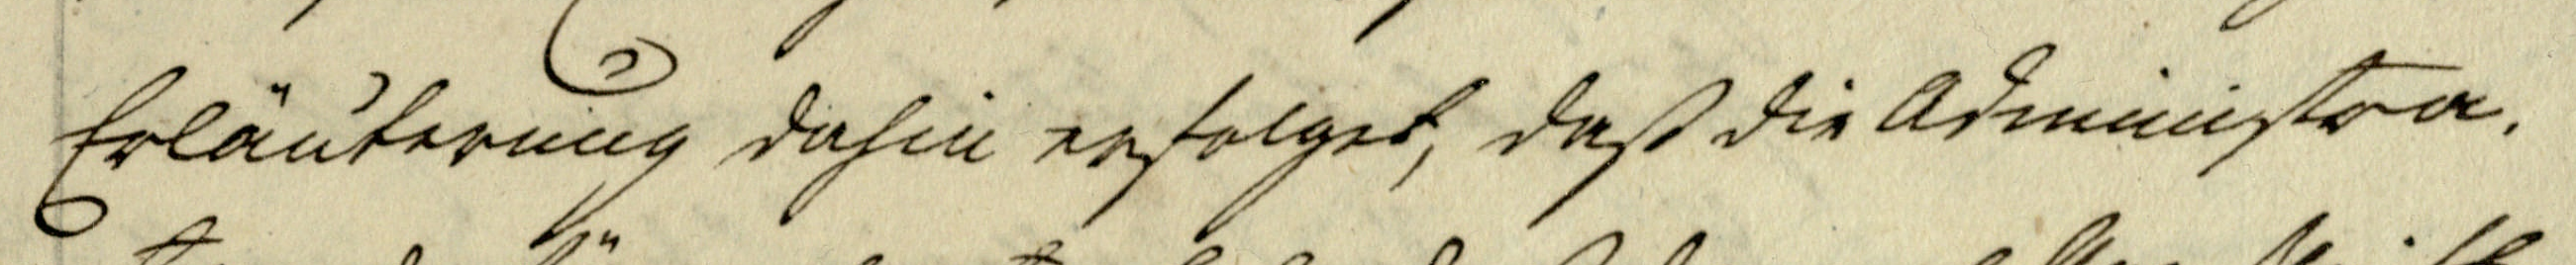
Erläuterung dahin erfolget, daß die Administra¬
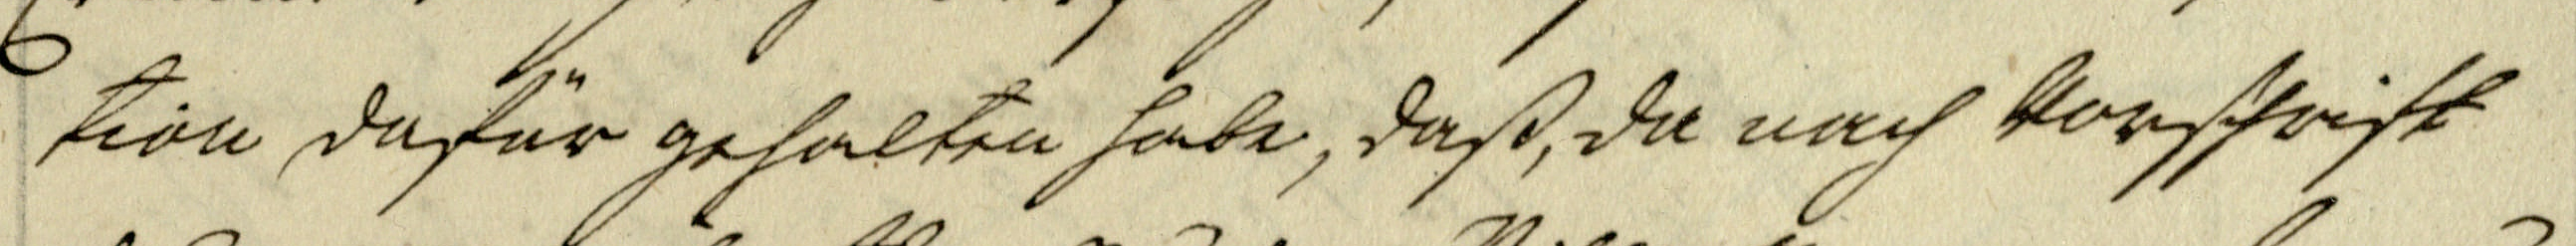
tion dafür gehalten habe, daß, da nach Vorschrift
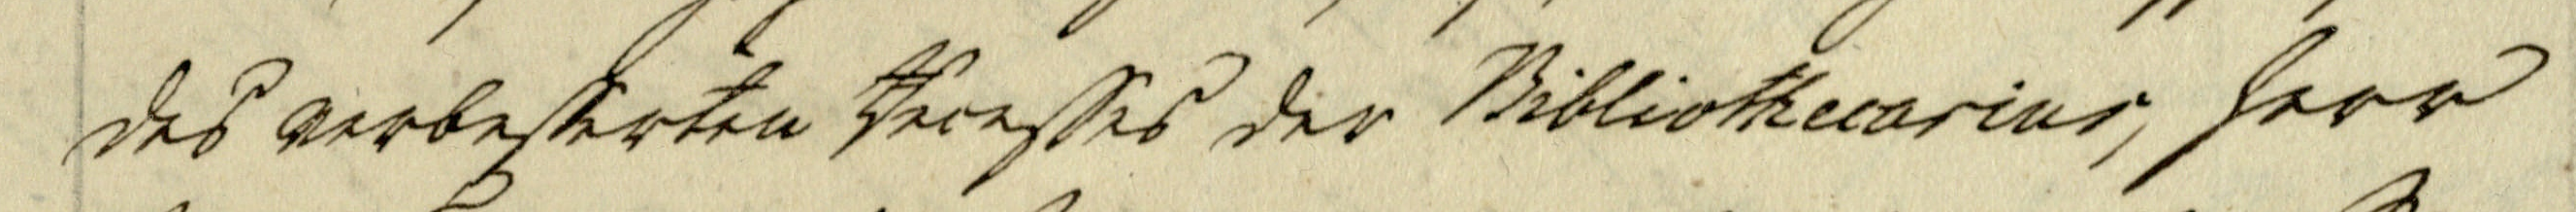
des verbesserten Recesses der Bibliothecarius, Herr
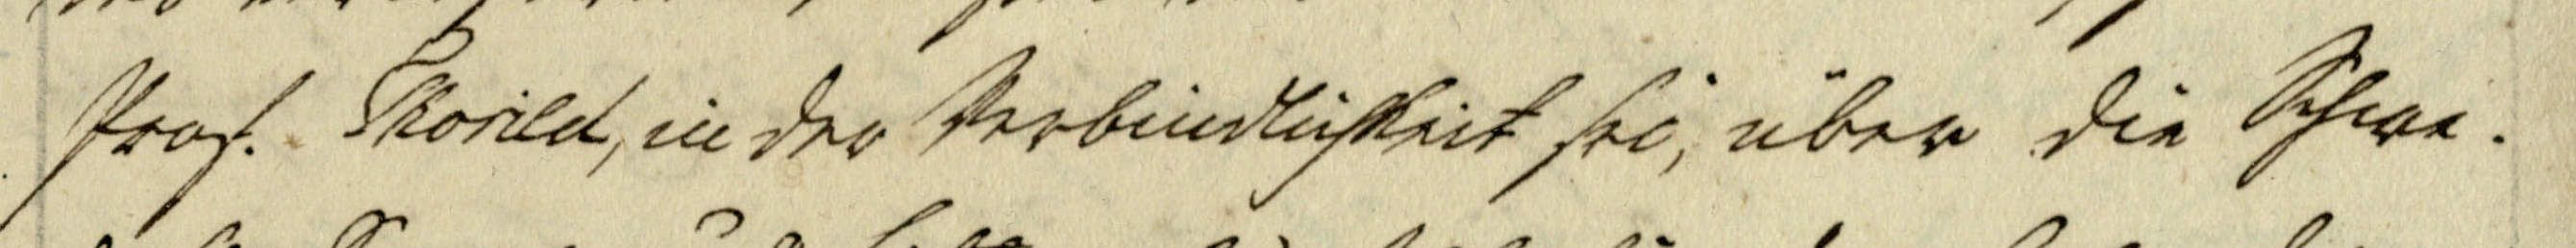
Prof. Thorild, in der Verbindlichkeit sei, über die Schwe¬
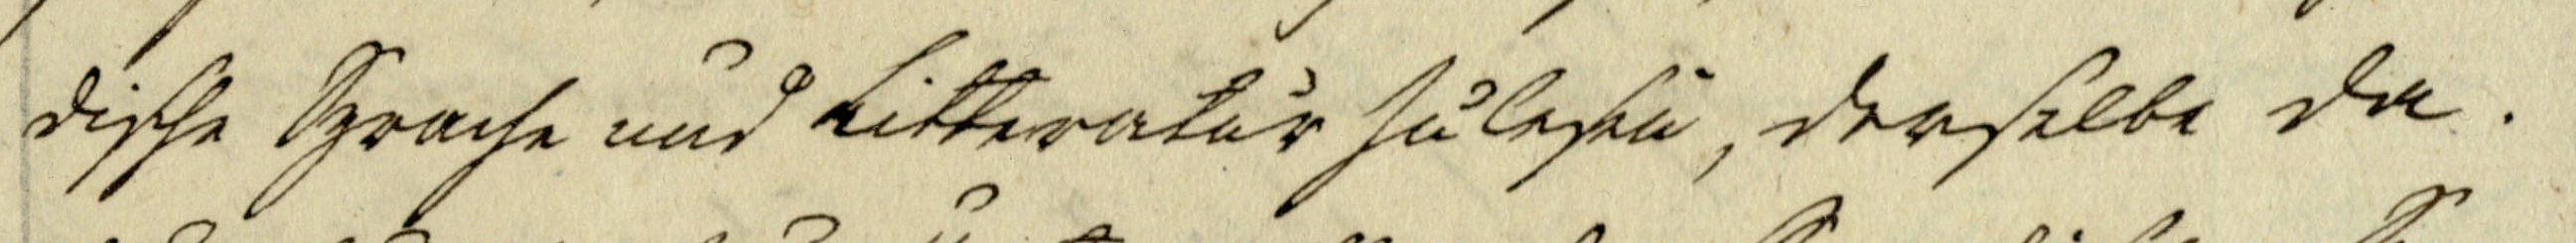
dische Sprache und Litteratur zulesen, derselbe da¬
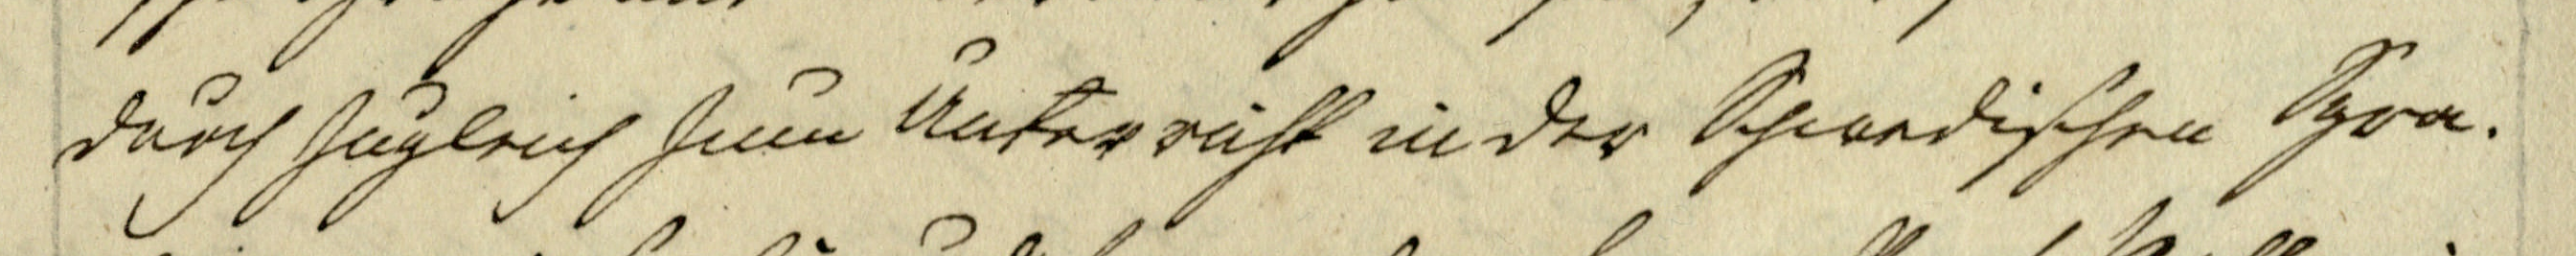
durch zugleich zum Unterricht in der Schwedischen Spra¬
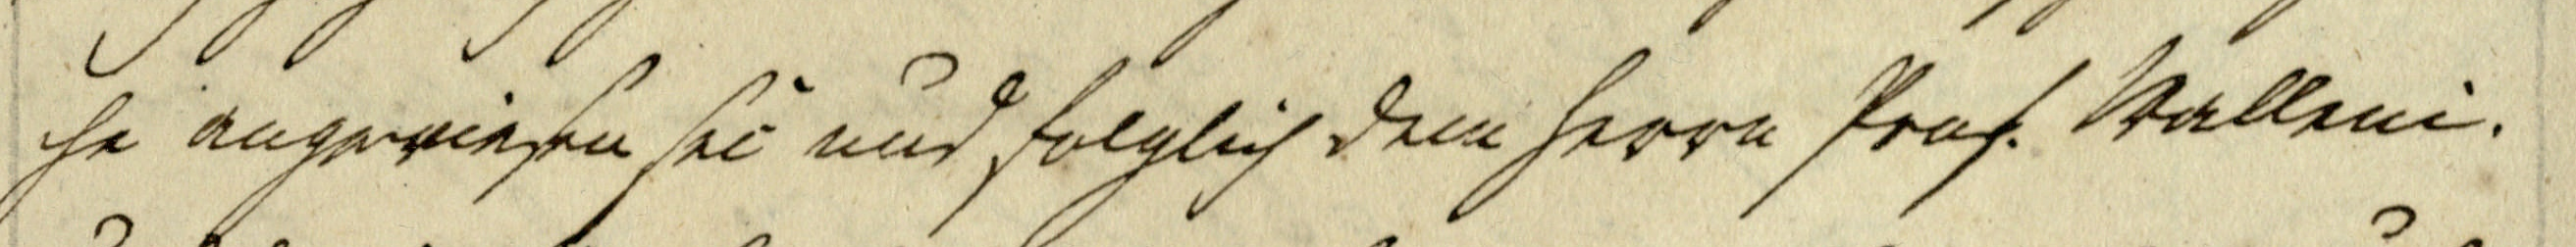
che angewiesen sei und folglich dem Herrn Prof. Walleni¬
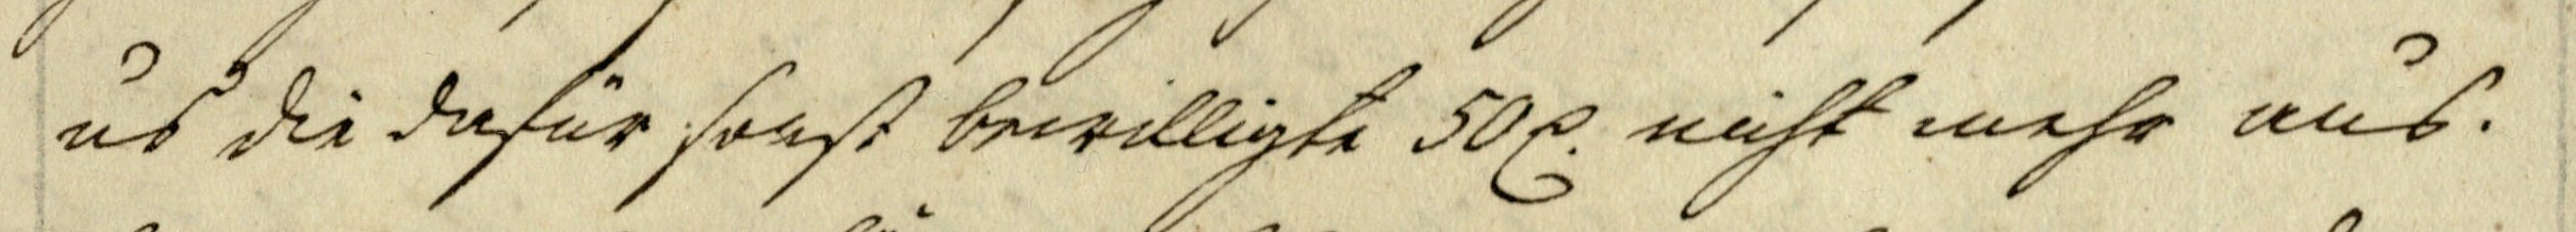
us die dafür sonst bewiligte 50 l. nicht mehr aus¬
